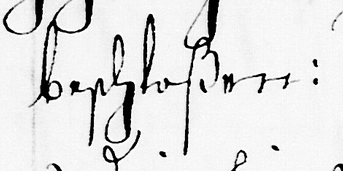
beschloßen:
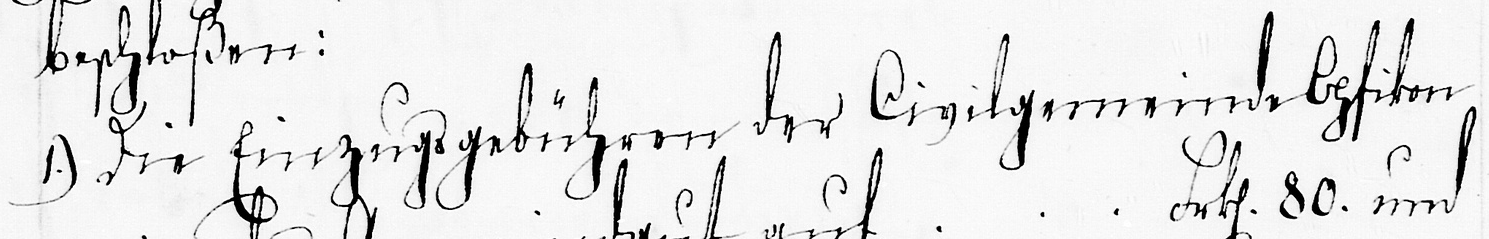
1.) Die Einzugsgebühren der Civilgemeine Opfikon
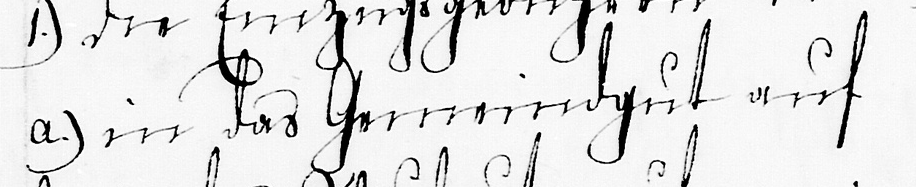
a.) in das Gemeindgut auf
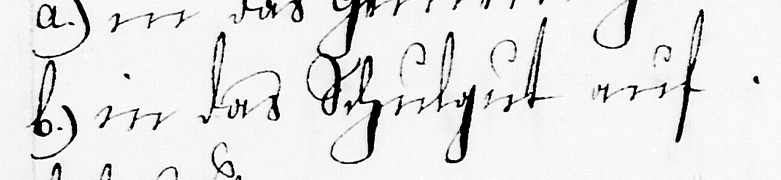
b.) in das Schulgut auf
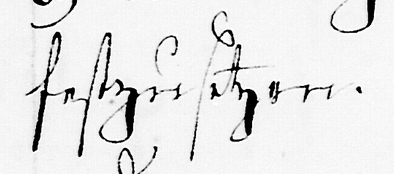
festzusetzen.
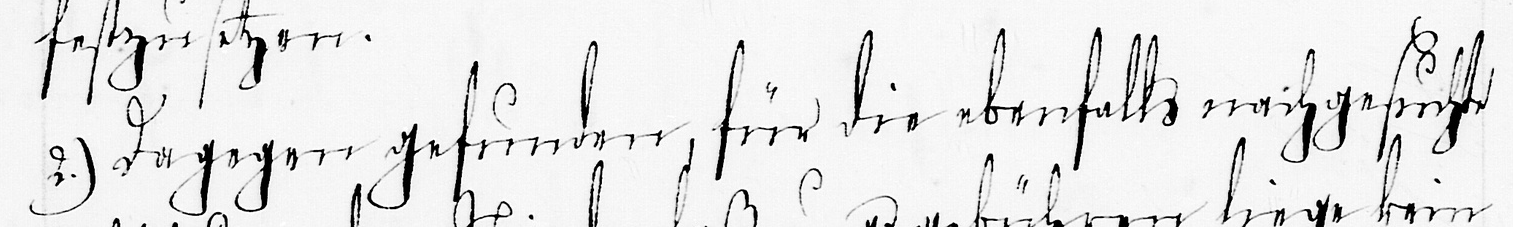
2.) Dagegen gefunden, für die ebenfalls nachgesuch¬
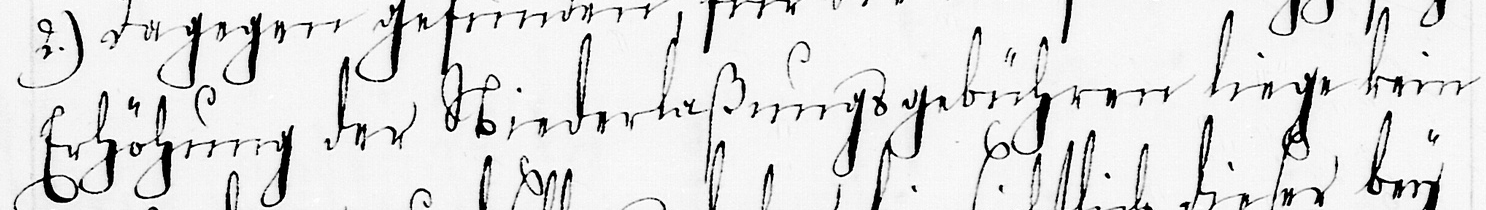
Erhöhung der Niederlaßungsgebühren liege kein
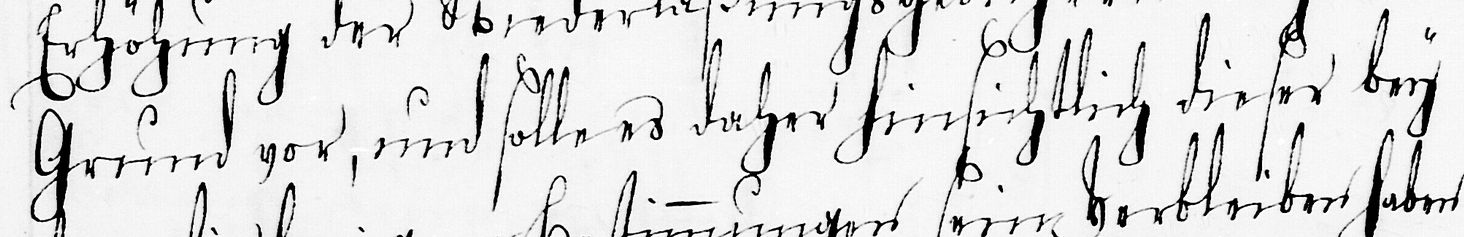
Grund vor, und solle es daher hinsichtlich dieser bey
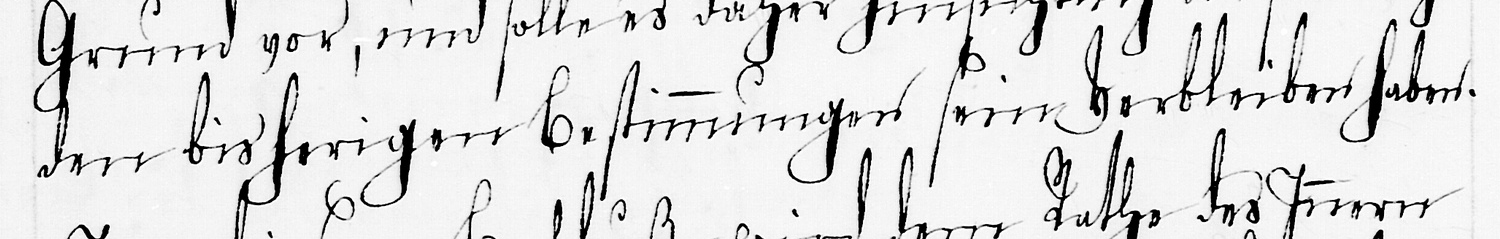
den bisherigen Bestimmungen sein Verbleiben haben.
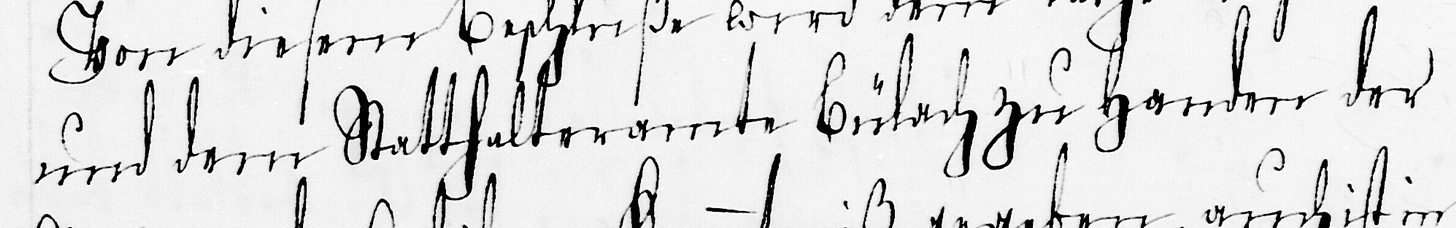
und dem Statthalteramte Bülach zu Handen der
